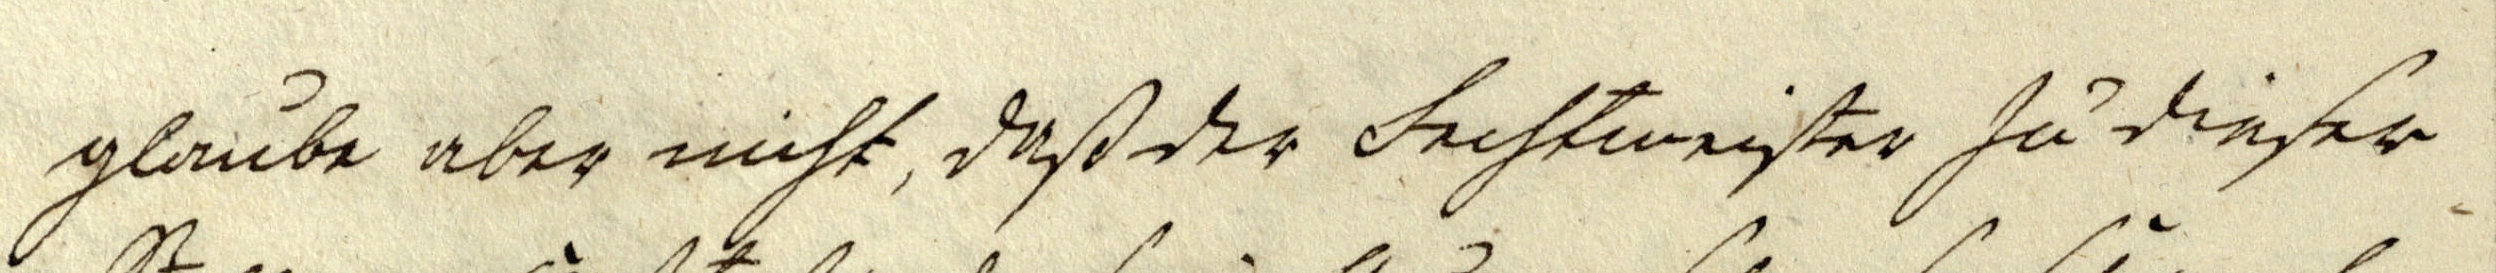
glaube aber nicht, daß der Fechtmeister zu dieser
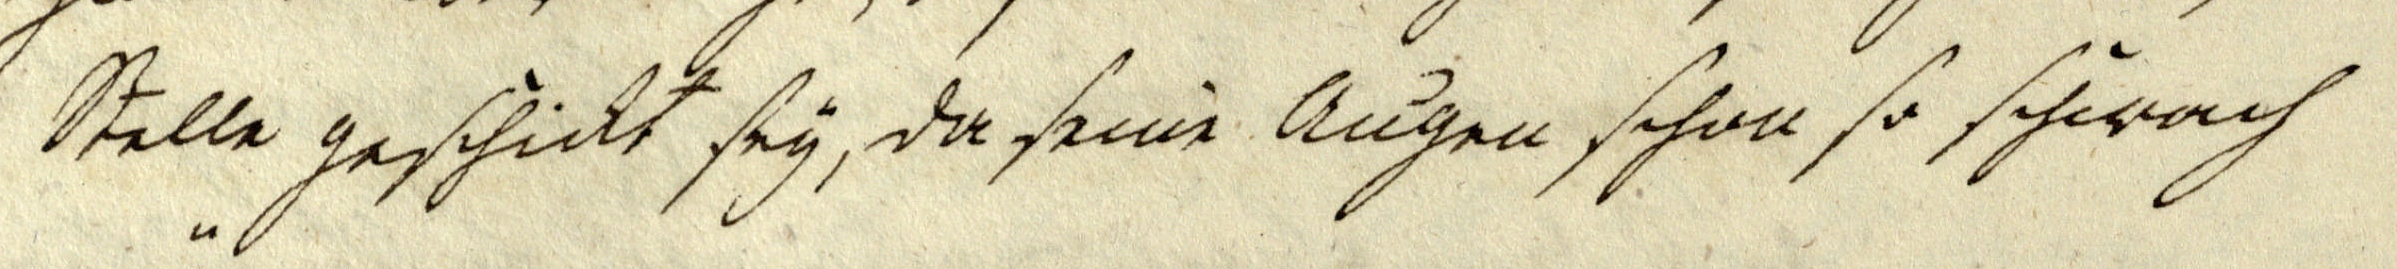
Stelle geschickt seÿ, da seine Augen schon so schwach
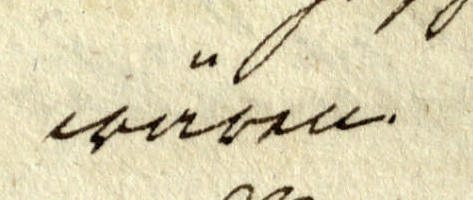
wären.
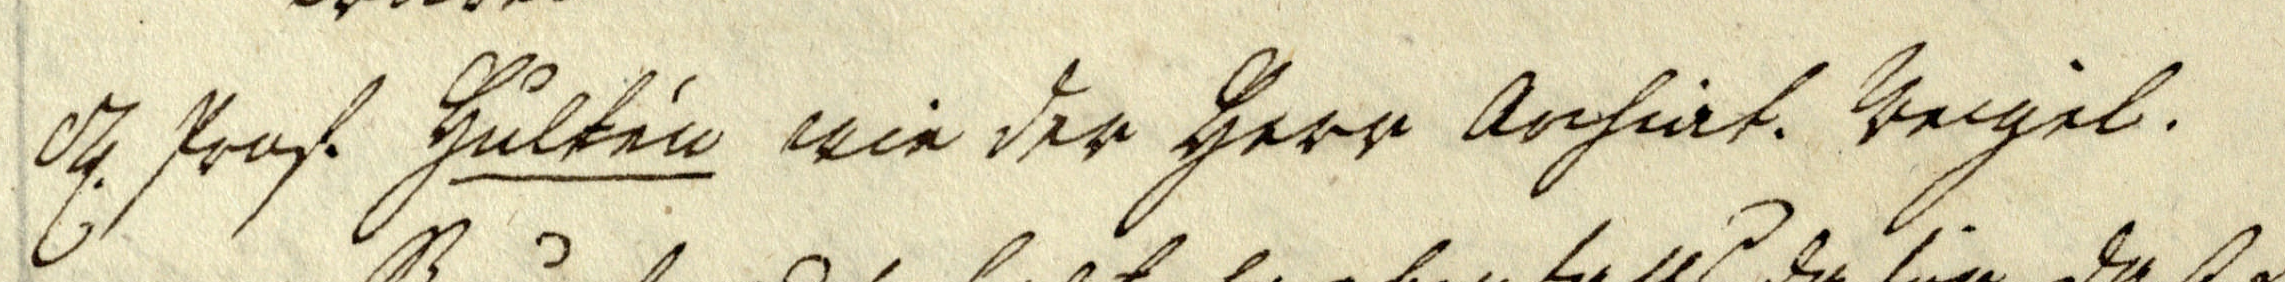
dh. Prof. Hultén wie der Herr Archiat. Weigel.
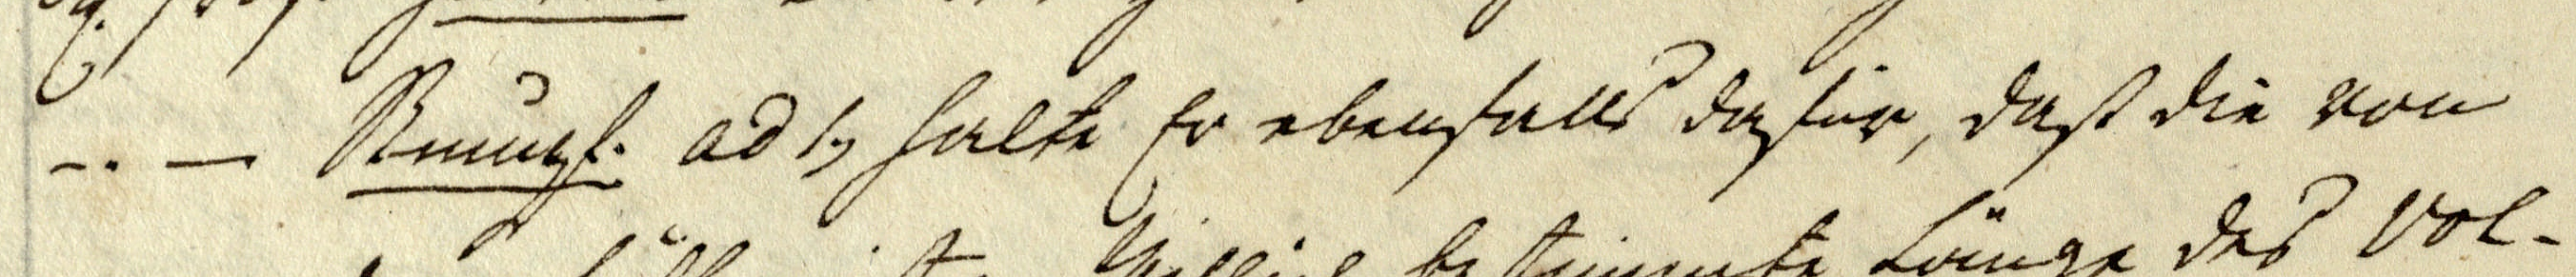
Stumpf. ad 1. halte Er ebenfalls dafür, daß die von
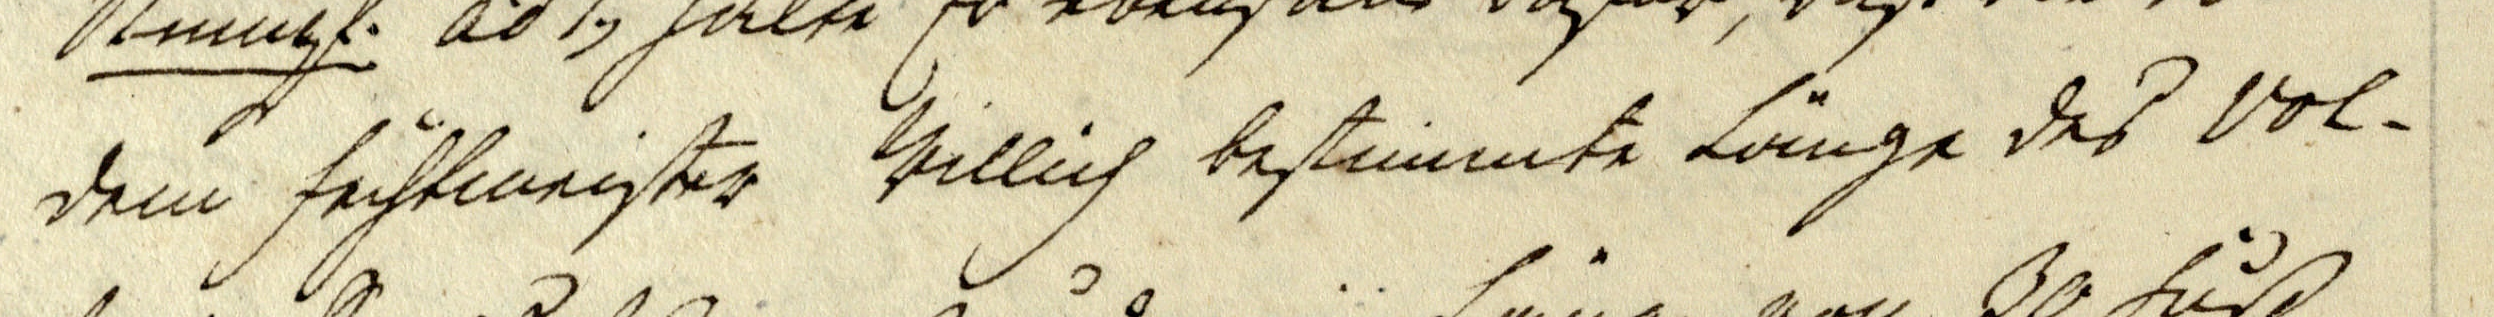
dem Fechtmeister Willich bestimmte Länge des Vol¬
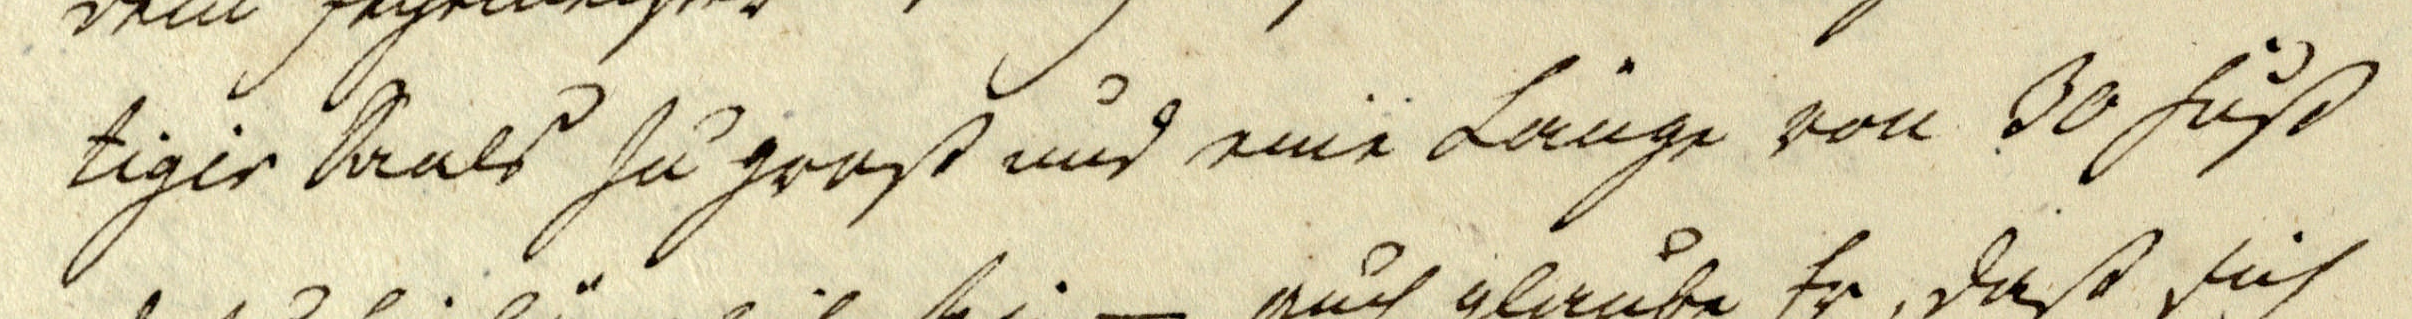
tigir Saals zu groß und eine Länge von 30 Fuß
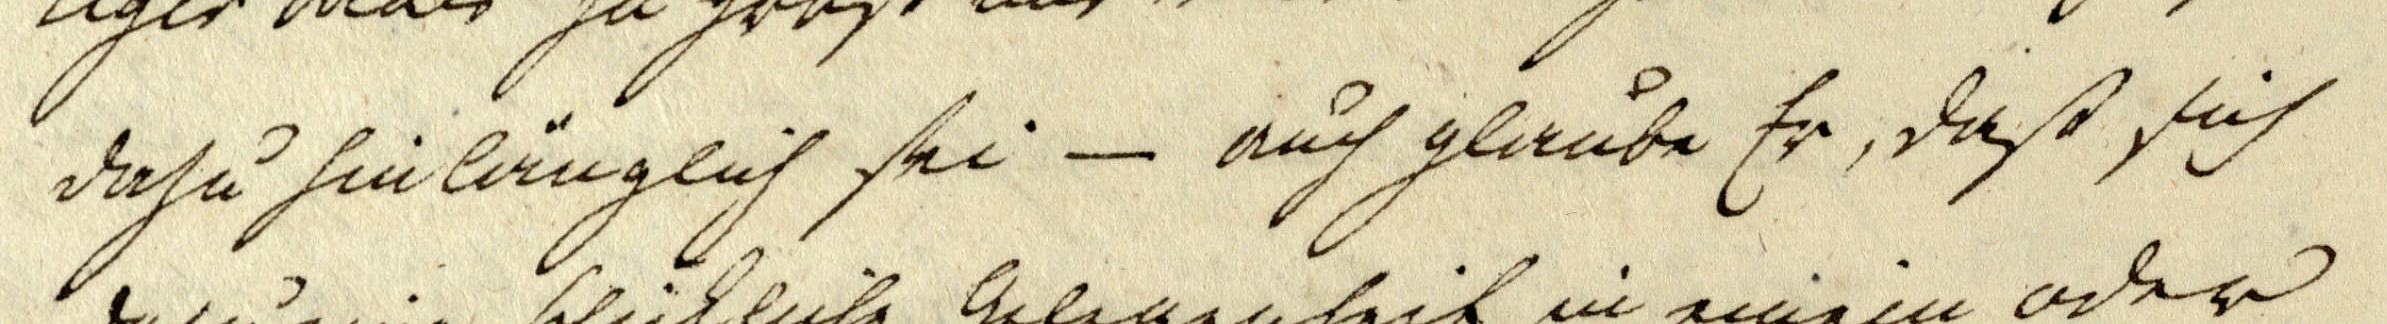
dazu hinlänglich sei auch glaube Er, daß sich
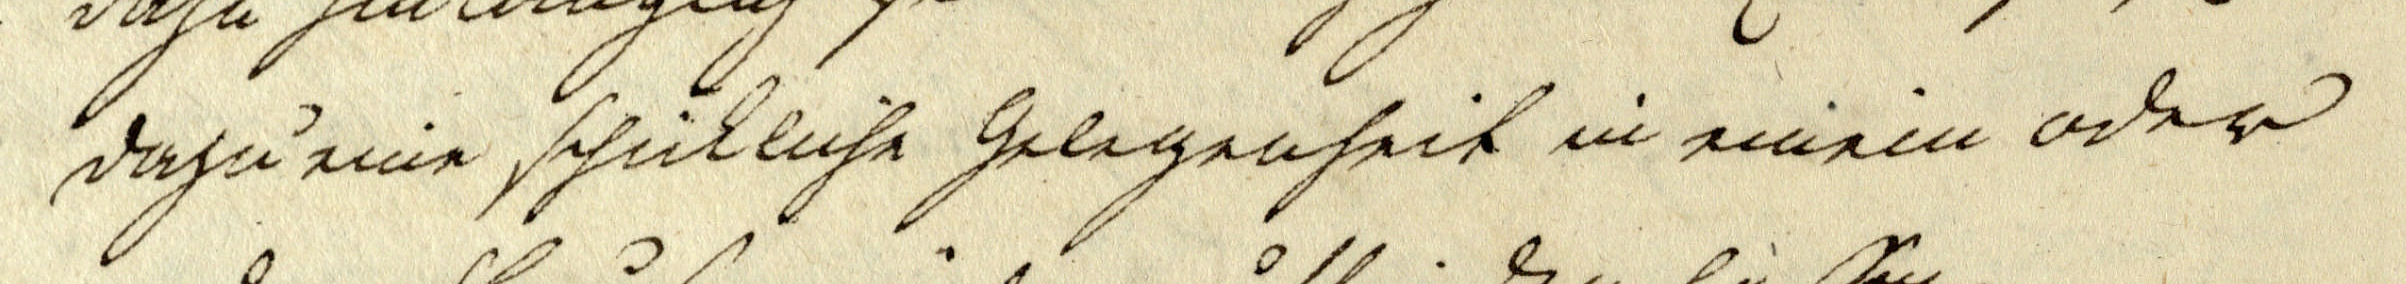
dazu eine schickliche Gelegenheit in einem oder
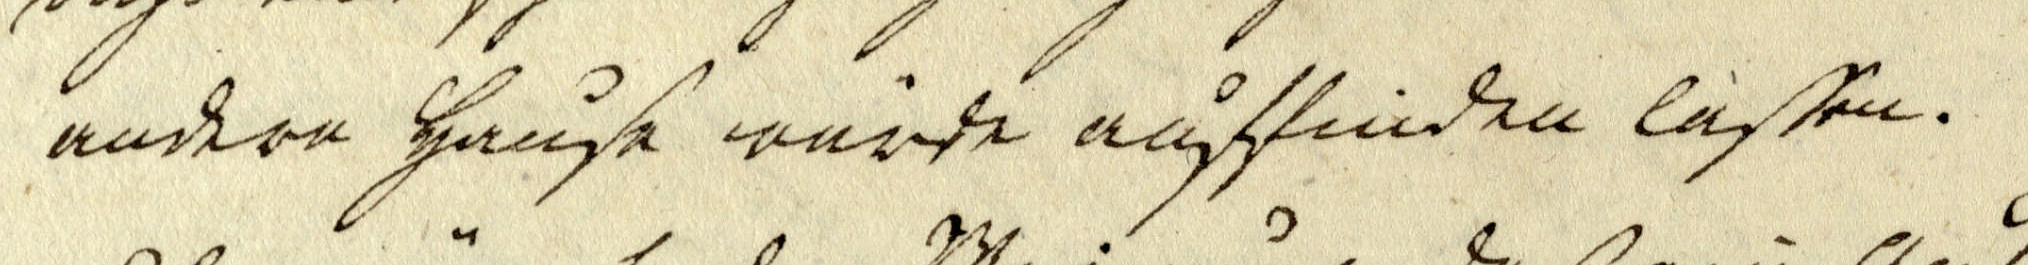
andern Hause würde auffinden lassen.
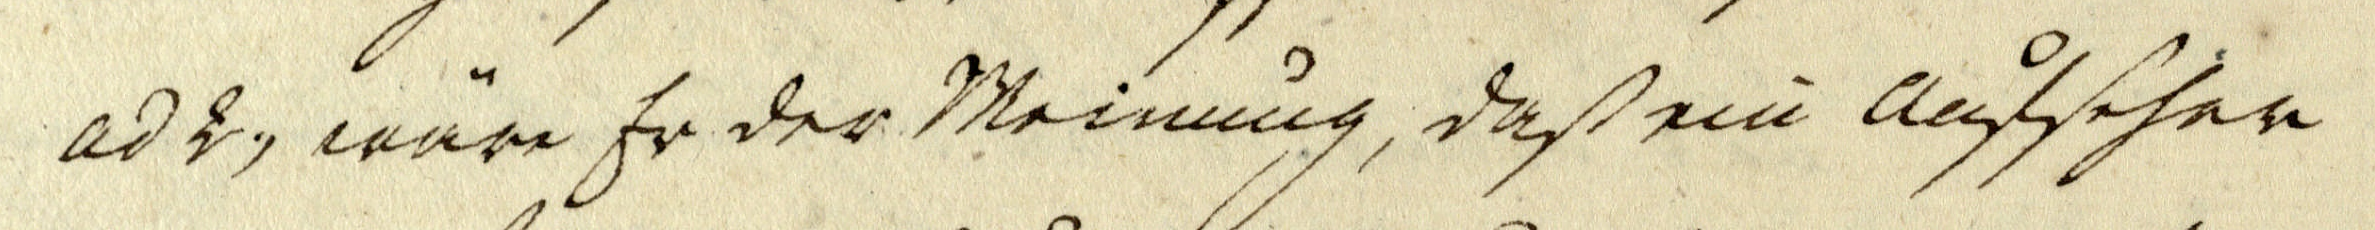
ad 2, wäre Er der Meinung, daß ein Aufseher
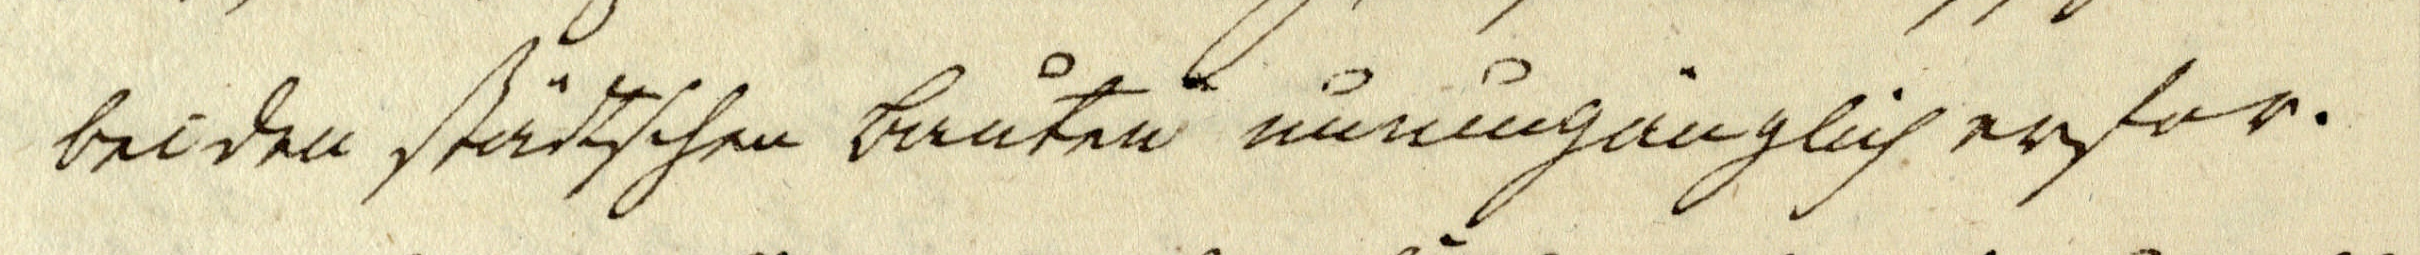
bei den städtschen Bauten unumgänglich erfor¬
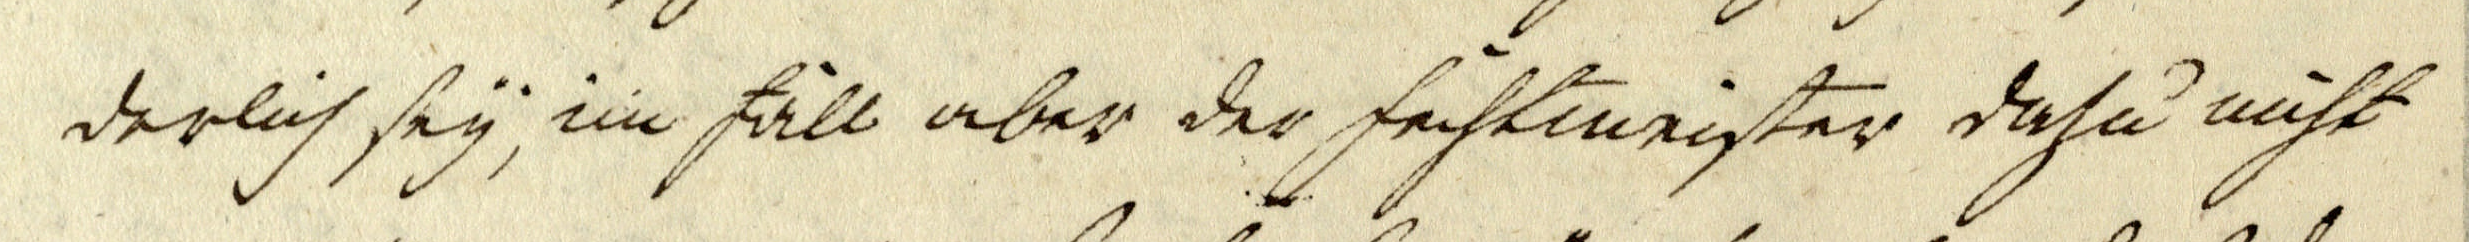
derlich seÿ, im Fall aber der Fechtmeister dazu nicht
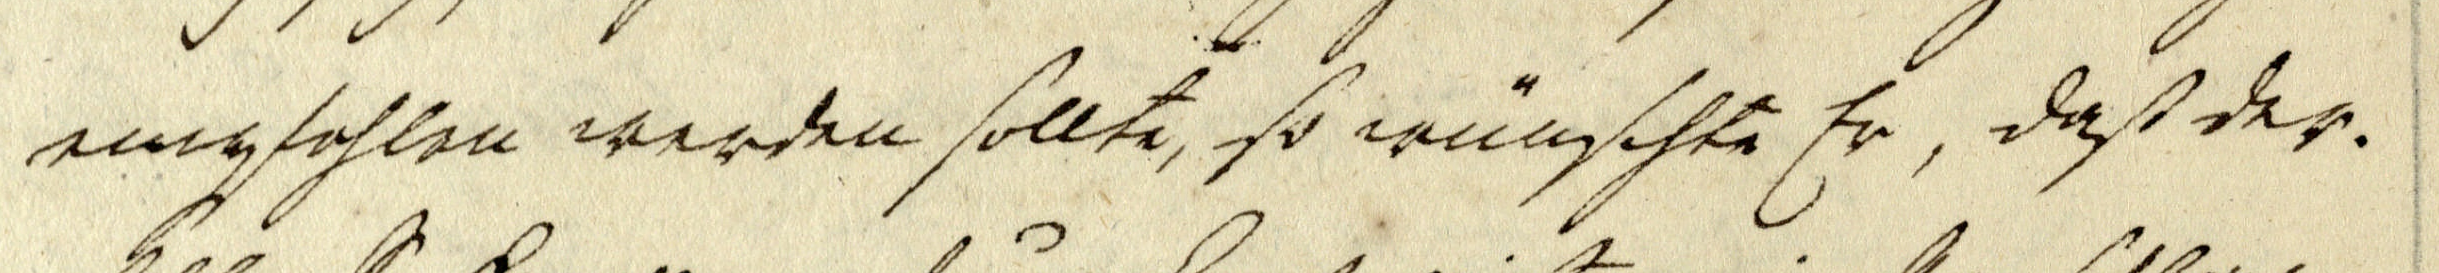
empfohlen werden sollte, so wünschte Er, daß der¬
